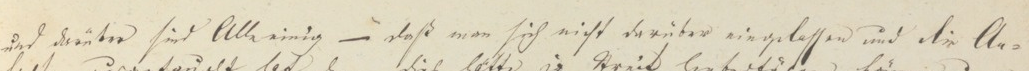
und darüber sind Alle einig – daß man sich nicht darüber eingelassen und die An-
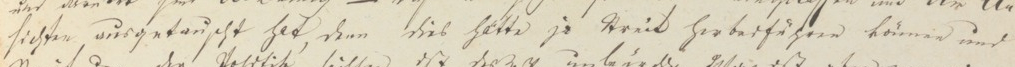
sichten ausgetauscht hat, denn dies hätte ja Streit herbeiführen können und
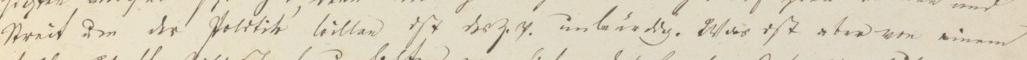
Streit um der Politik willen ist des Z.V. unwürdig. Was ist aber von einem
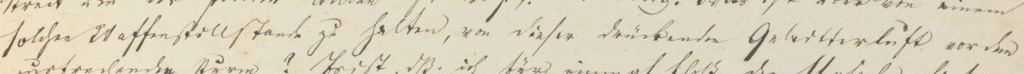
solchen Waffenstillstand zu halten, von dieser drückenden Gewitterluft vor dem
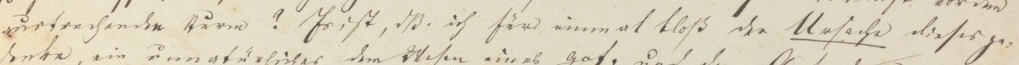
ausbrechenden Sturm? Es ist, dß. ich für einmal bloß der Ursache dieses ge-
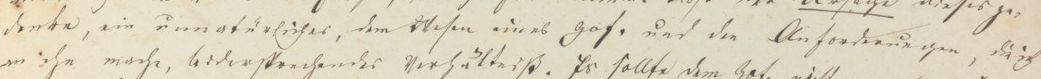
denke, ein unnatürliches, dem Wesen eines Zof. und den Anforderungen, die ich
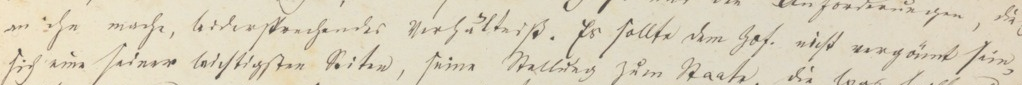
an ihn mache, widersprechendes Verhältniß. Es sollte dem Zof. nicht vergönnt sein,
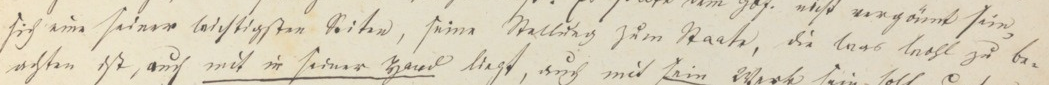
sich eine seiner wichtigsten Seiten, seine Stellung zum Staate, die was wohl zu be-
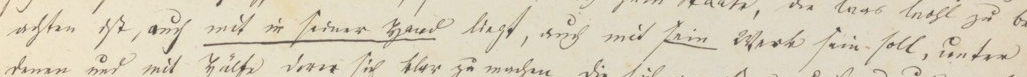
achten ist, auch mit in seiner Hand liegt, auch mit sein Werk sein soll, unter
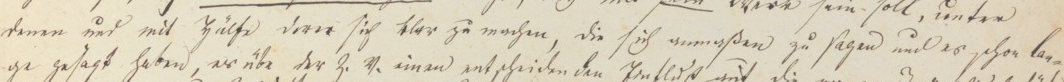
denen und mit Hülfe derer sich klar zu machen, die sich anmaßen zu sagen und es schon lan-
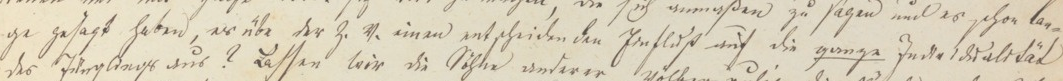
ge gesagt haben, es übe der Z.V. einen entscheidenden Einfluß auf die ganze Individualität
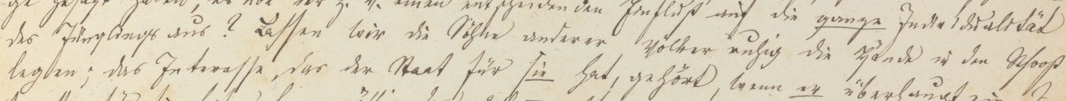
des Jünglings aus? Lassen wir die Söhne anderer Völker ruhig die Hände in den Schooß
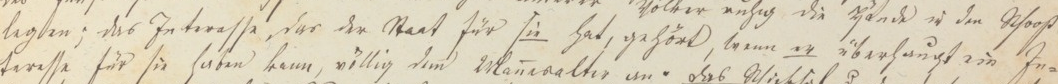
legen; das Interesse, das der Staat für sie hat, gehört, wenn er überhaupt ein In-
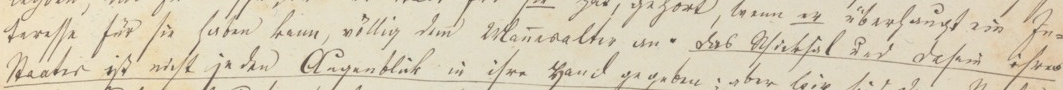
teresse für sie haben kann, völlig dem Mannesalter an. Das Schicksal und Dasein ihres
